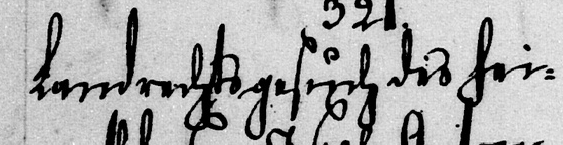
Landrechtsgesuch des he¬
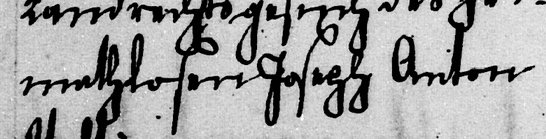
imathlosen Joseph Anton
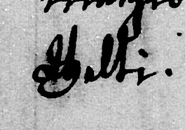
Welti.
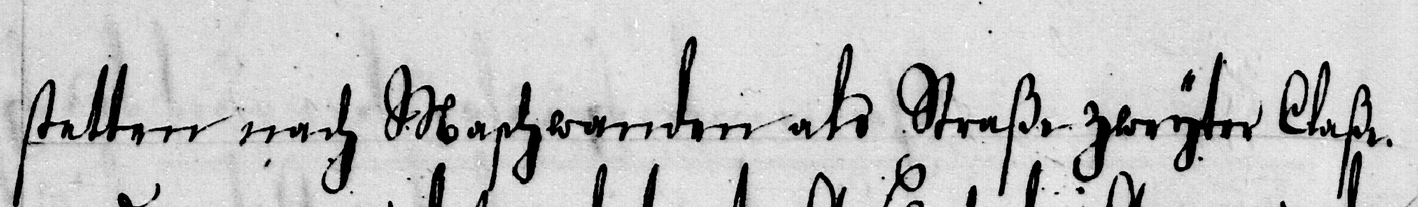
stetten nach Maschwanden als Straße zweyter Claße.
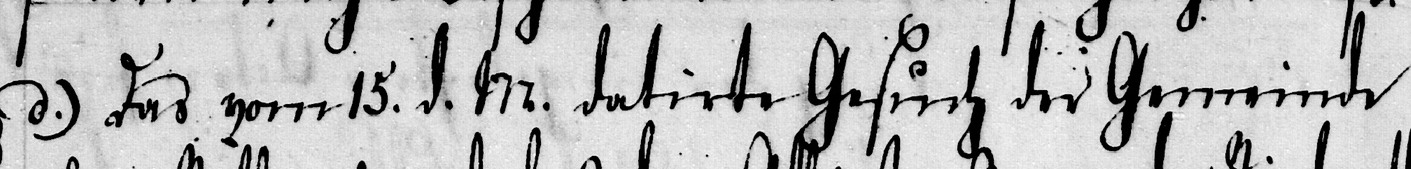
d.) Das vom 15. d. M. datirte Gesuch der Gemeinde
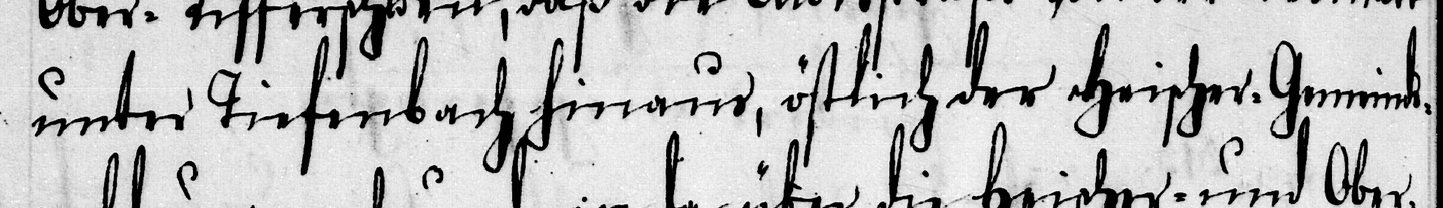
unter Tiefenbach hinaus, östlich der Heischer-Gemein¬
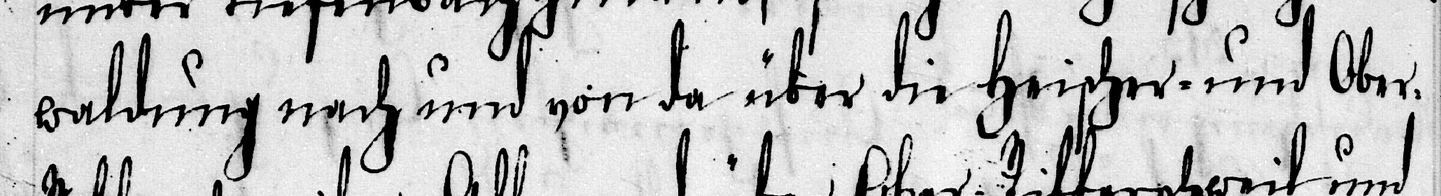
waldung nach und von da über die Heischer- und Obe¬
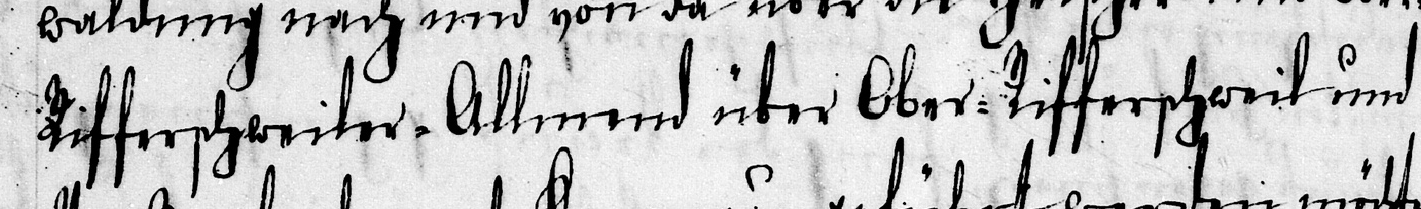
ifferschweiler-Allmend über Ober-Rifferschweil und
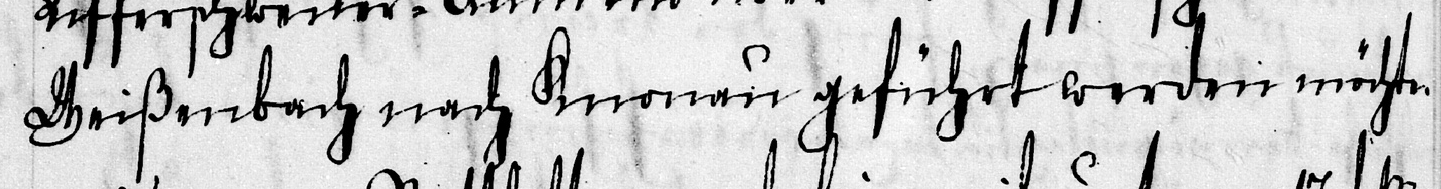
Weißenbach nach Knonau geführt werden möchte.
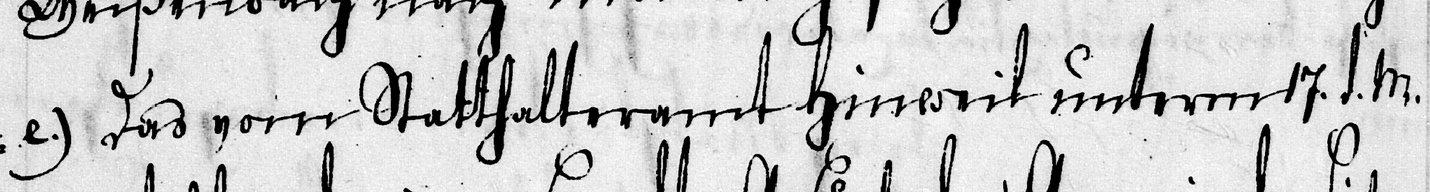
e.) Das vom Statthalteramt Hinweil unterm 17. d.
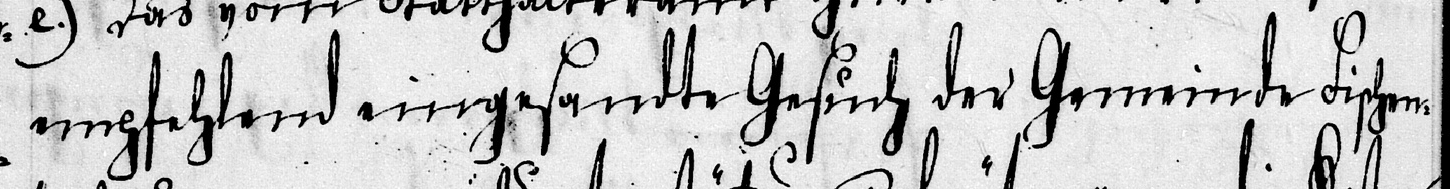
empfehlend eingesandte Gesuch der Gemeinde Fische¬
